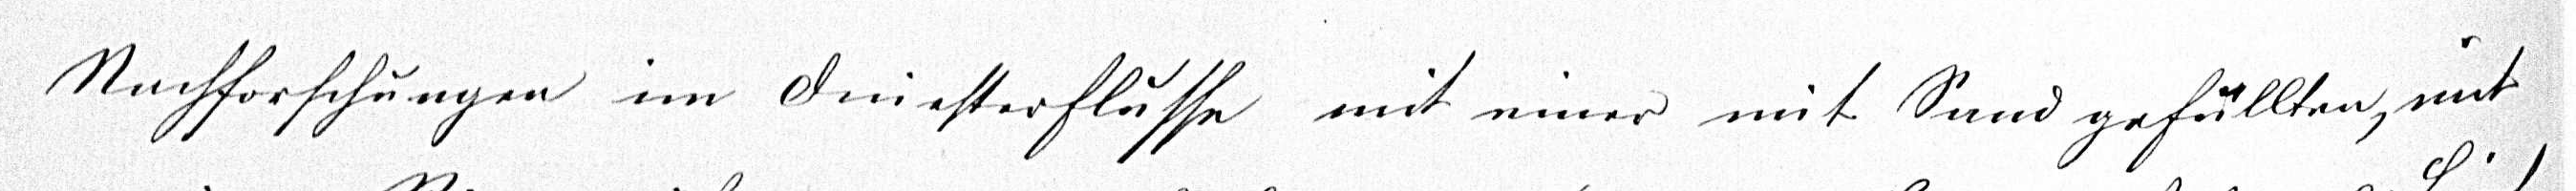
Nachforschungen im Dxxsterflusse mit einer mit Sand gefüllten, mit
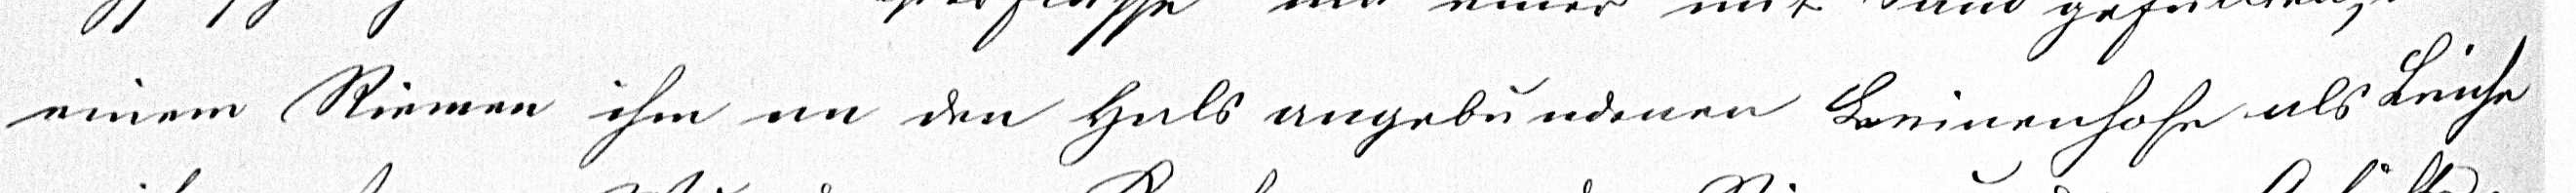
einem Riemen ihm an den Hals angebundenen Leinenhofe als Leiche
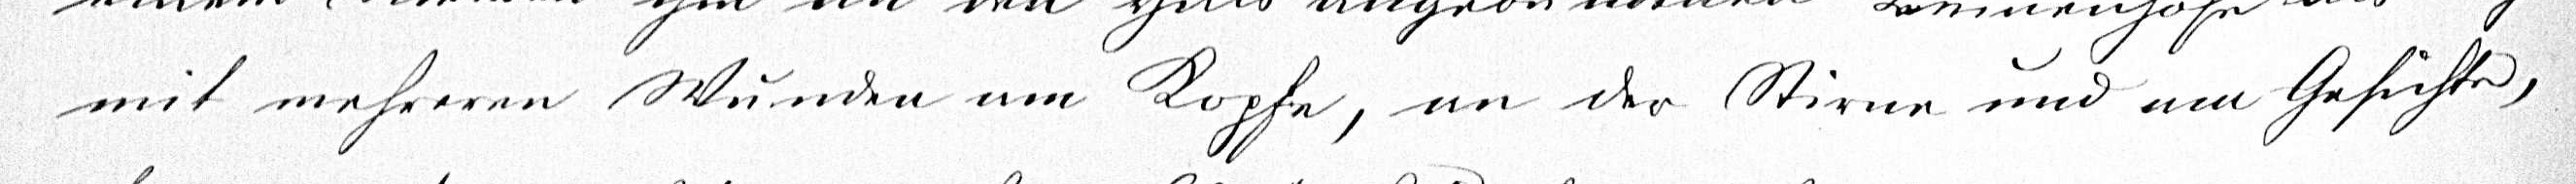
mit mehreren Wunden am Kopfe, an der Stirne und am Gesichte,
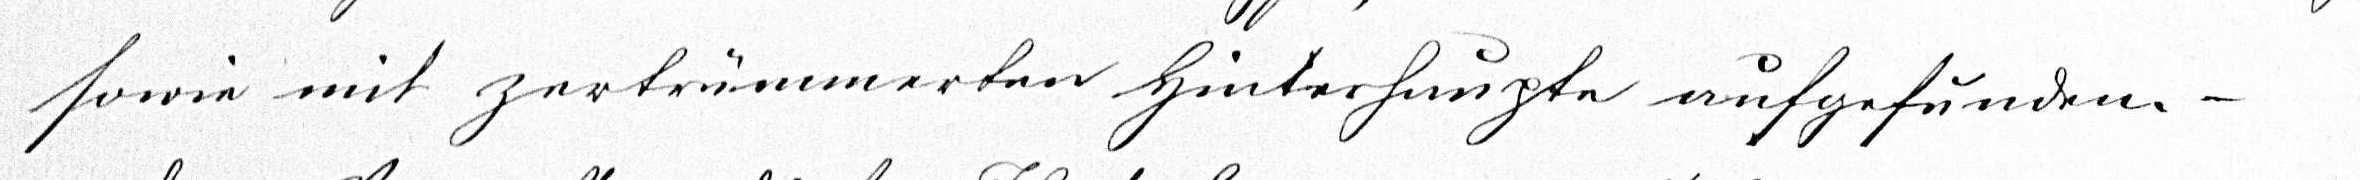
sowie mit zertrümmerten Hinterhaupte aufgefunden.-
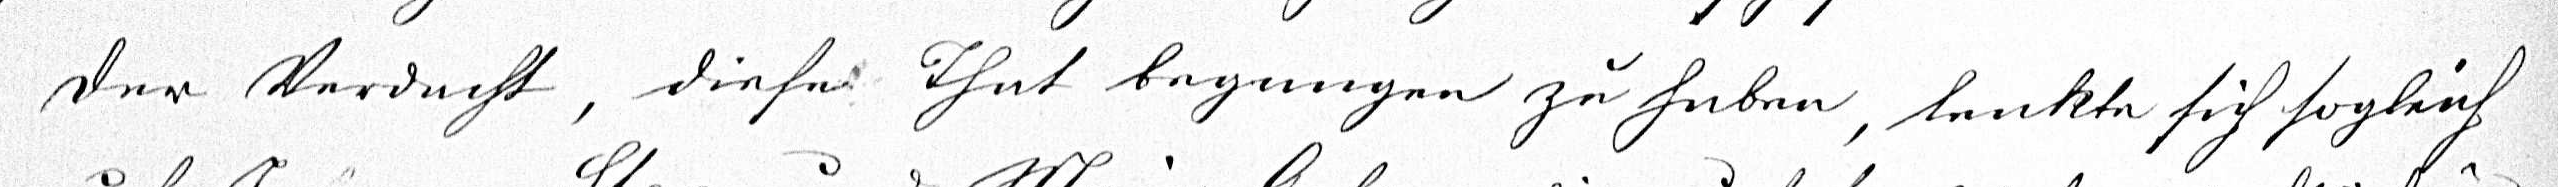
Der Verdacht, dieses That begangen zu haben, lenkte sich sogleich
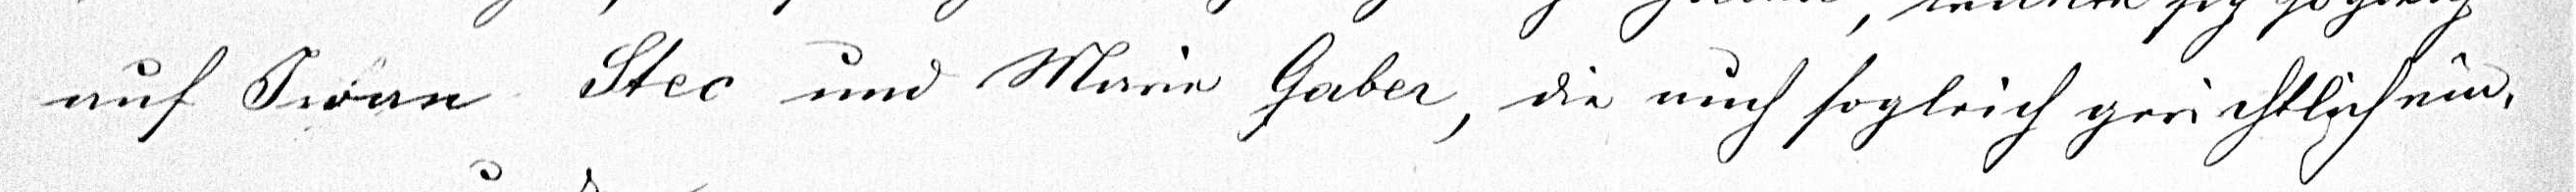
auf Jwan Stec und Marie Gaber, die auch sogleich gerichtlich ein¬
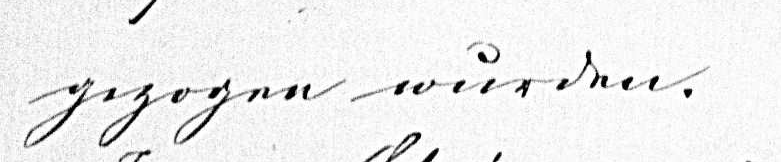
gezogen wurden.
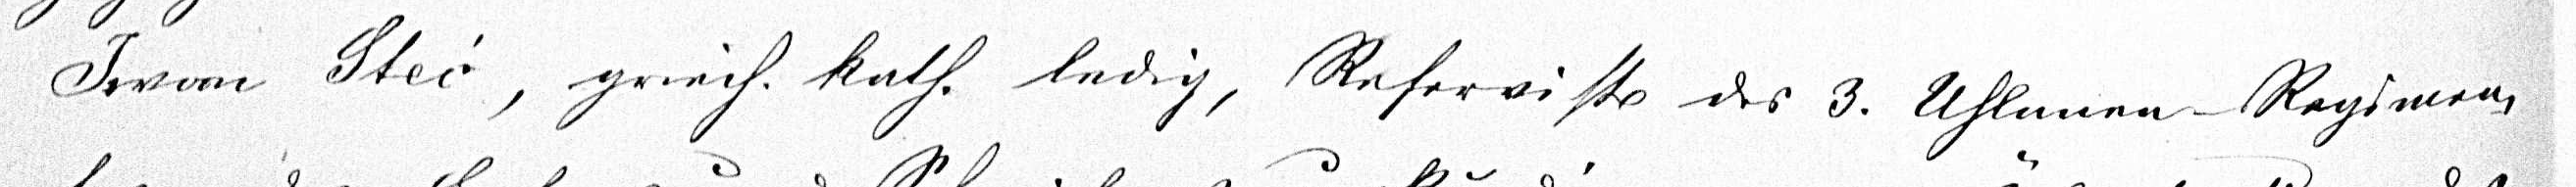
Jwan Steć, greih. kath. ledig, Reservist des 3. Uhlanen Regimen¬
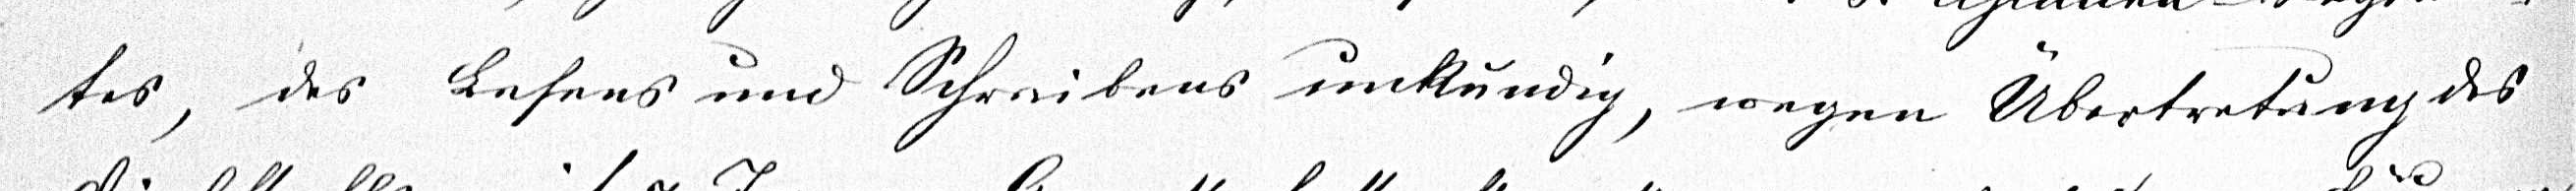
tes, des Lesens und Schreibens unkundig, wegen Übertretung des
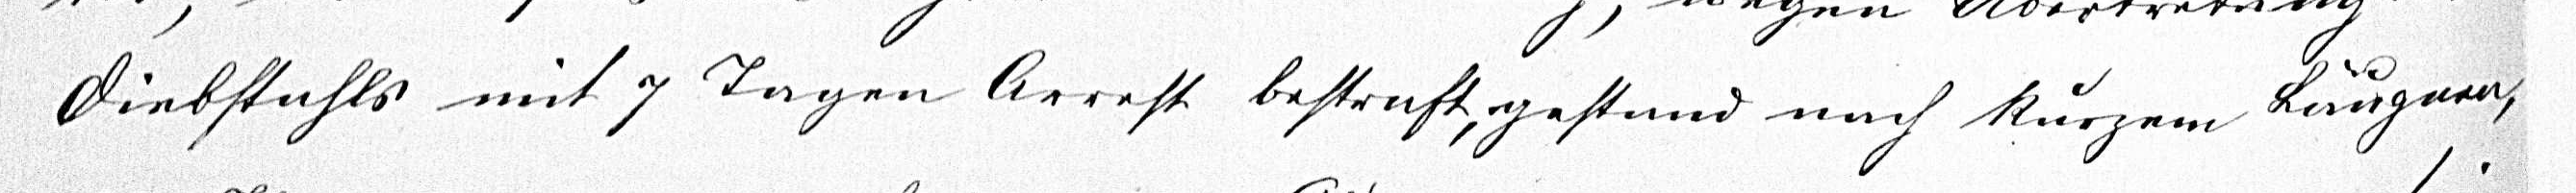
Diebstahls mit 7 Tagen Arrest bestraft, gestand nach kurzen Läugnen,
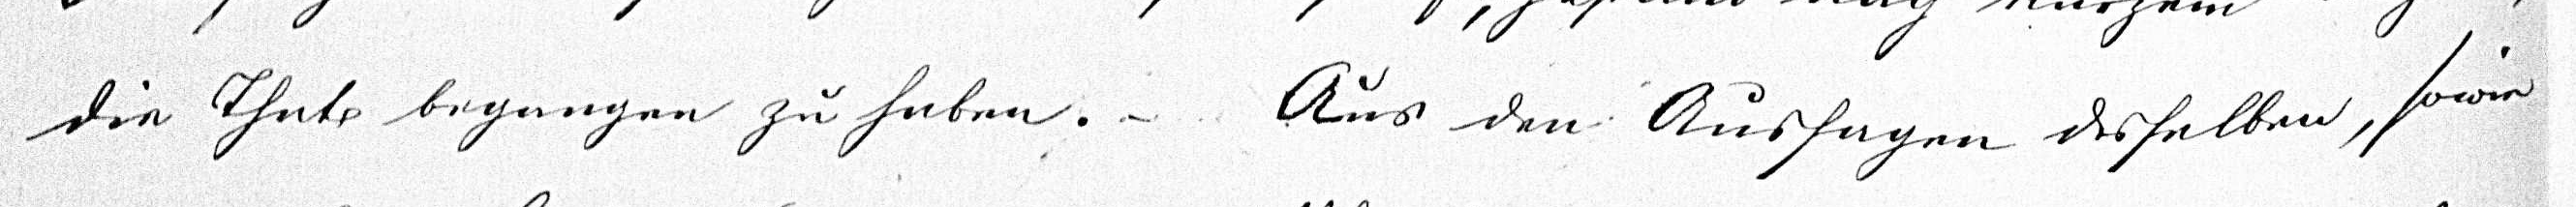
die That begangen zu haben.- Aus den Aussagen desselben, sowie
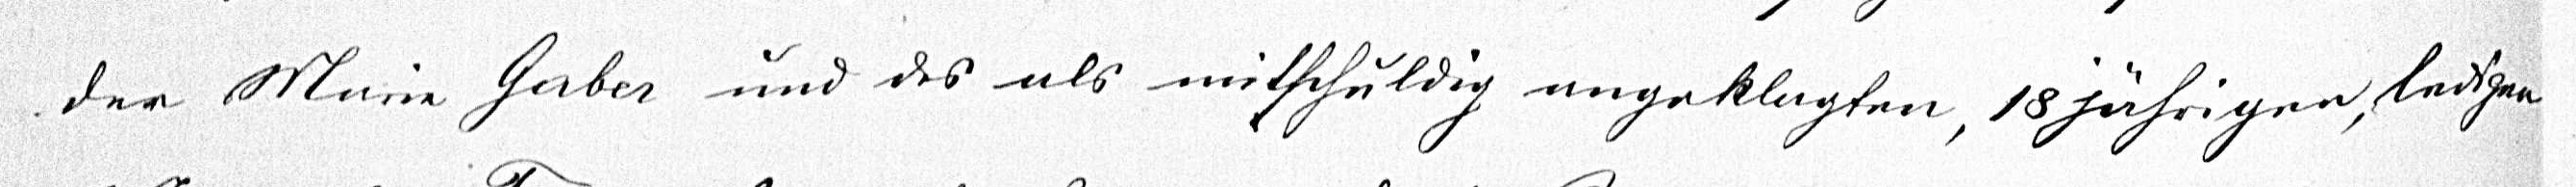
der Marie Gaber und des als mitschuldig angeklagten, 18 jährigen, ledigen
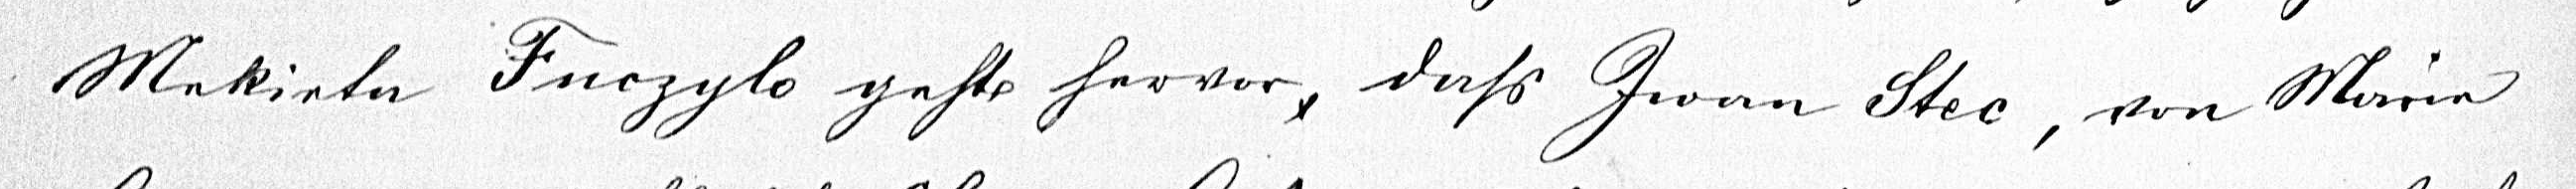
Mekietxx Fuczylo geht hervor dass Jwan Stec, von Marie
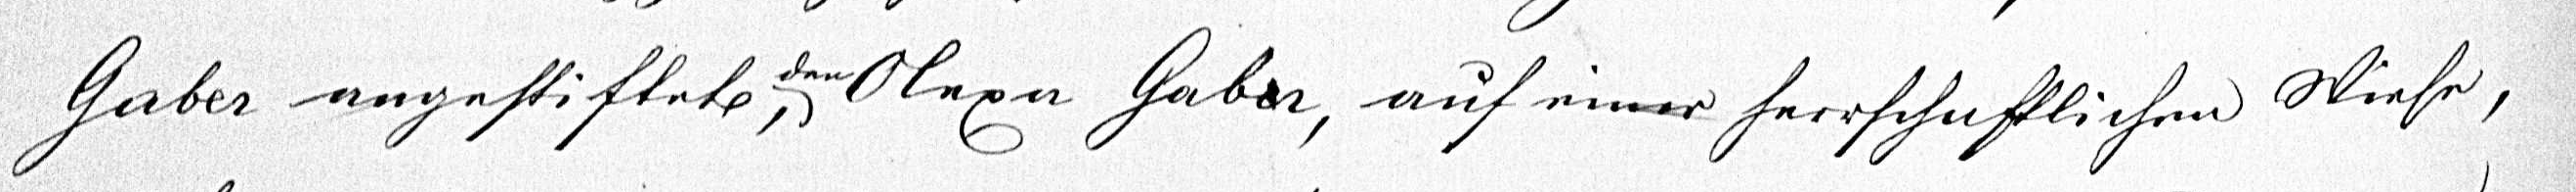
Gaber angestiftet, den Olexa Gaber, auf einer herrschaftlichen Wiese,
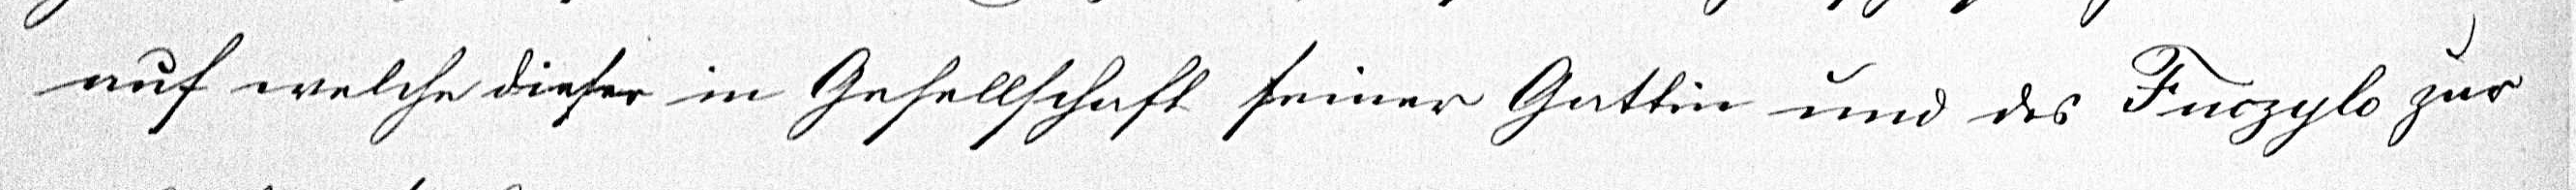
auf welche dieser in Gesellschaft seiner Gattin und des Fuczylo zur
